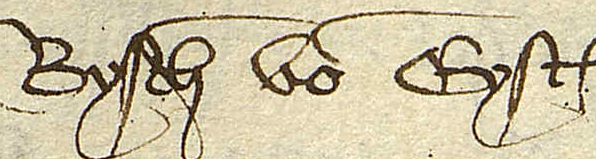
Byſch* vo* Eyſt*
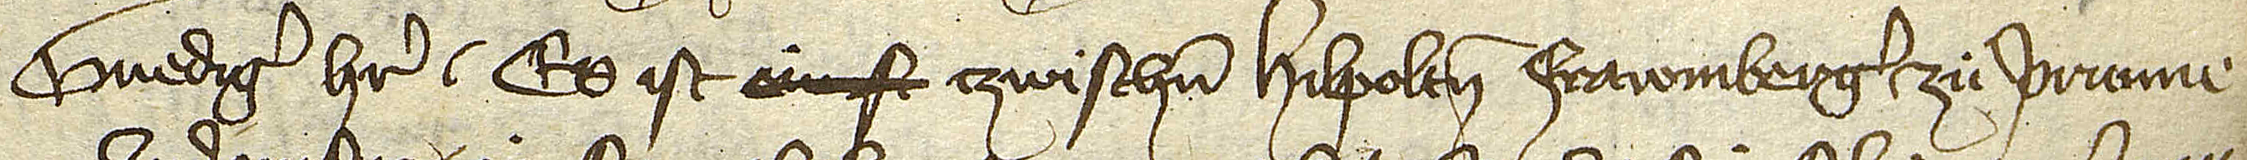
Gnedig* hr* / Es iſt ein f cʒwiſchn* Hilpoltn* Frawmberg* cʒü Prunne
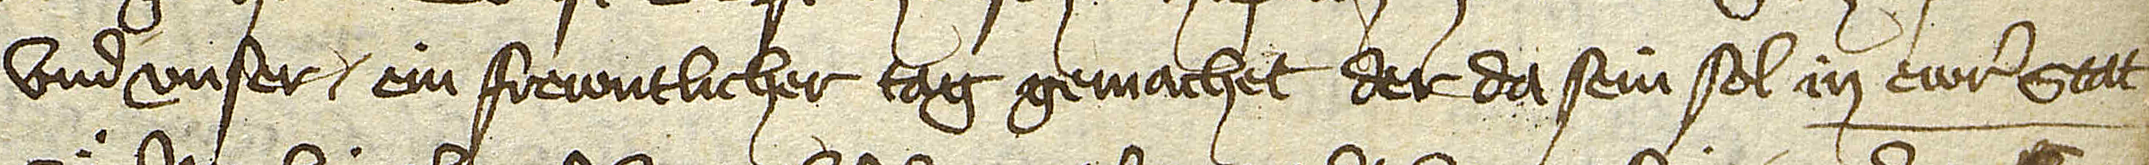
vnd vnſer / ein frewntlicher tag gemachet der da ſein ſol in ewr* Stat
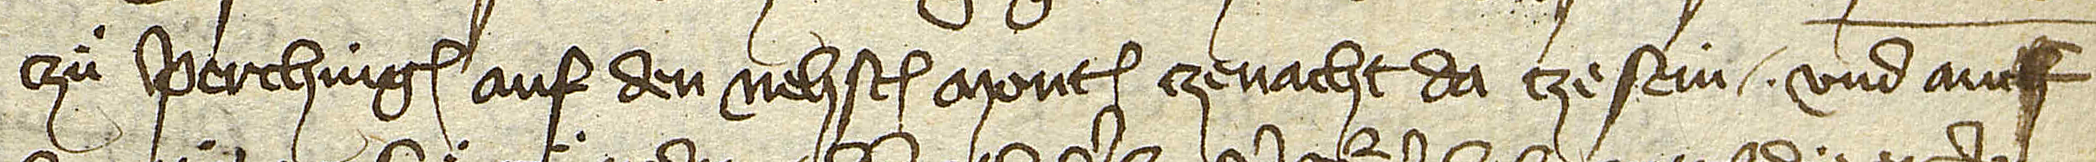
cʒü Perching* auf den nehſt* Mont* cʒenacht da cʒe ſein / . vnd auf
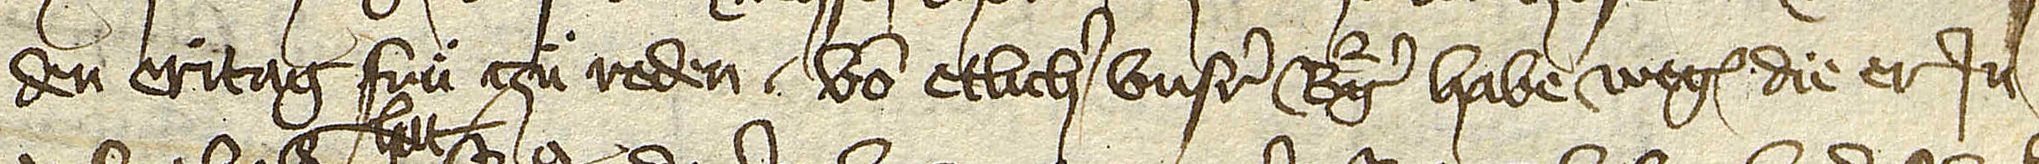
den eritag frü cʒü reden / vo* etlich* vnſr* B*g* habe weg* die er In
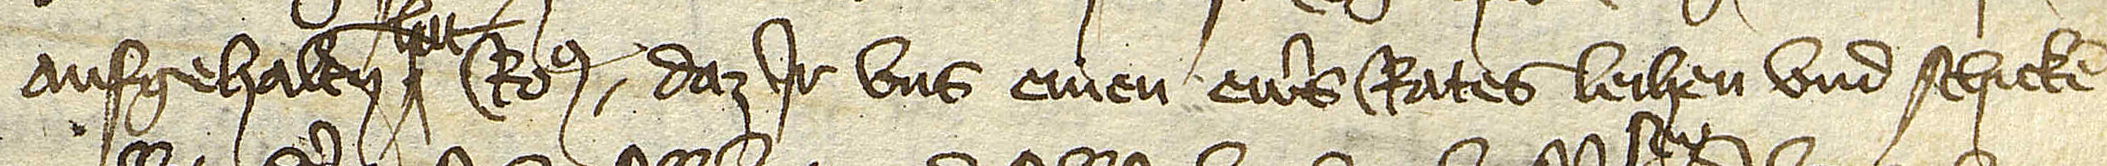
aufgehaltn* Ro* / daʒ Ir vns einen ew*s Rates leihen vnd ſchicke*
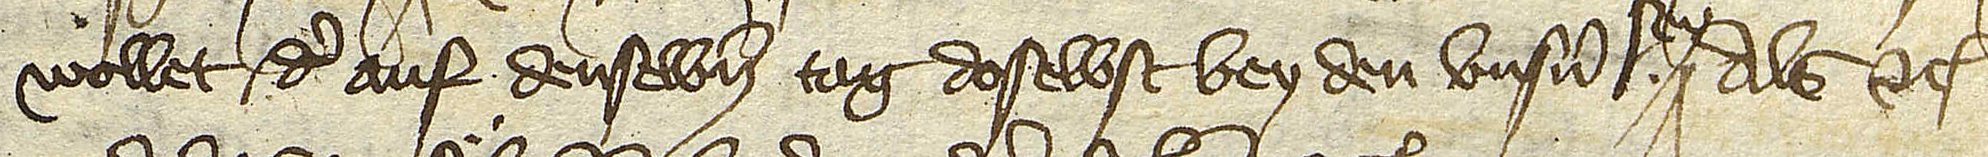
wöllet / d* auf denſelbn* tag doſelbſt bey den vnſn* ſey / . Als ec*
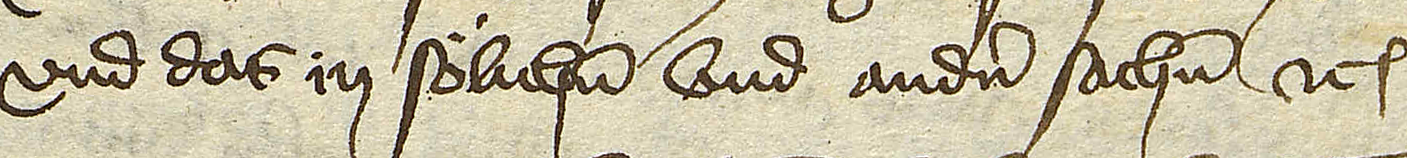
vnd das in ſölichn* vnd andn* ſachn* ec*
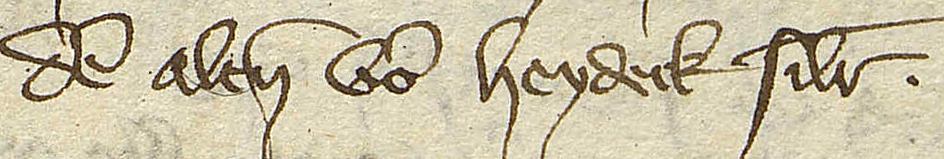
D* altn* vo* heydeck ſilr* .
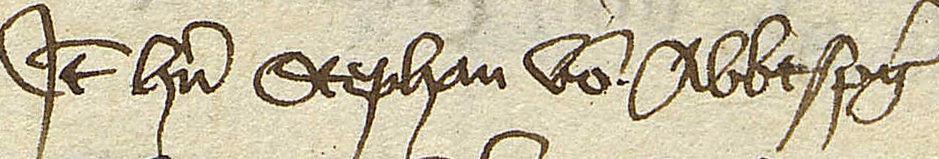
It hn* Stephan vo*. Abbtſp*g
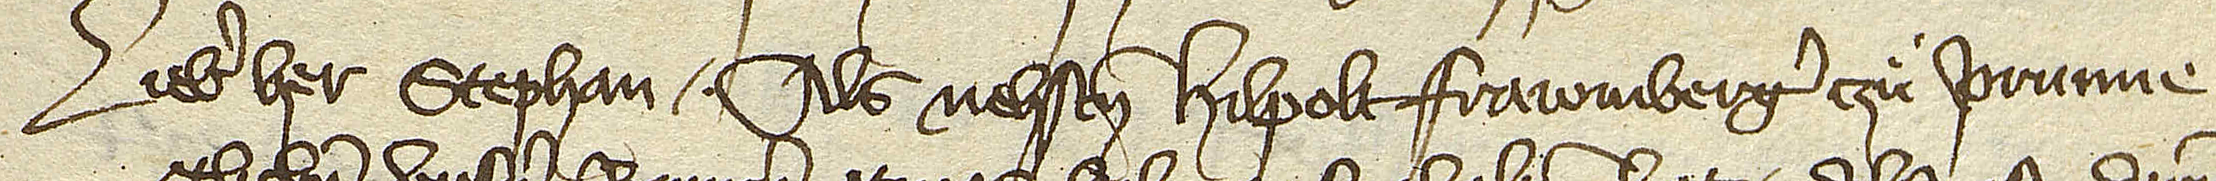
Lieb* her Stephan / . Als nehſtn* Hilpolt Frawmberg* cʒü Prunne
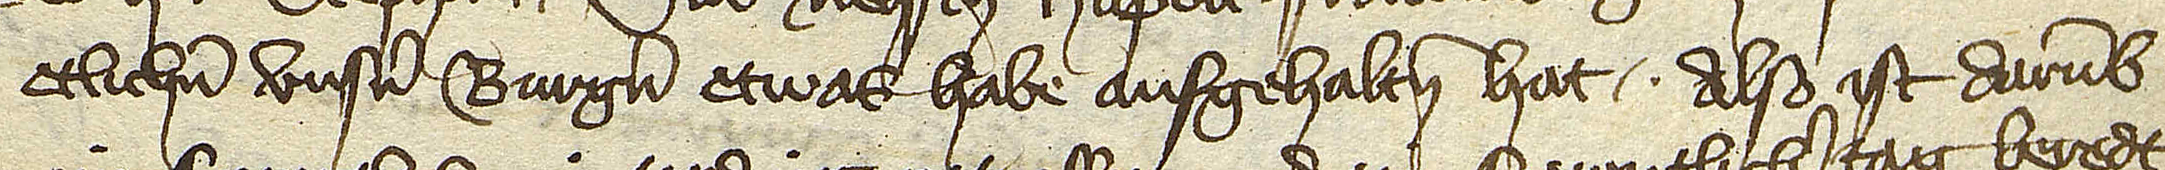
etlichn* vnſn* Burgn* etwas habe aufgehaltn* hat / . Alſo iſt darub*
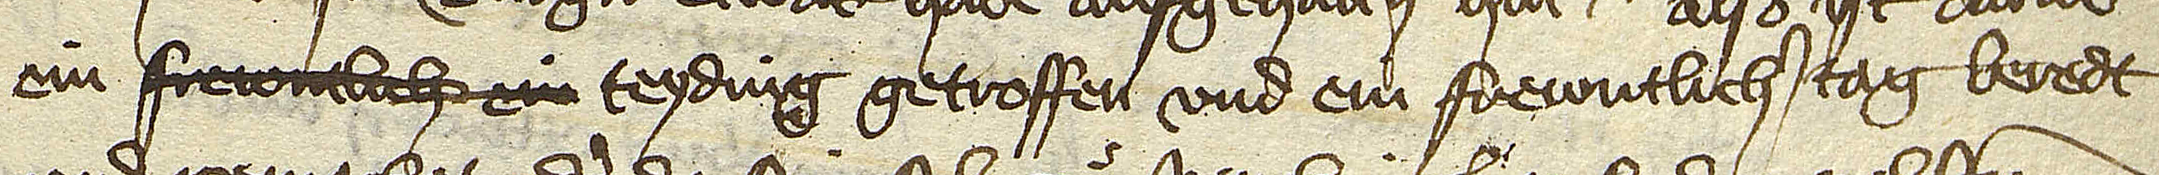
ein frewntlich ein teyding getroffen vnd ein frewntlich* tag beredt
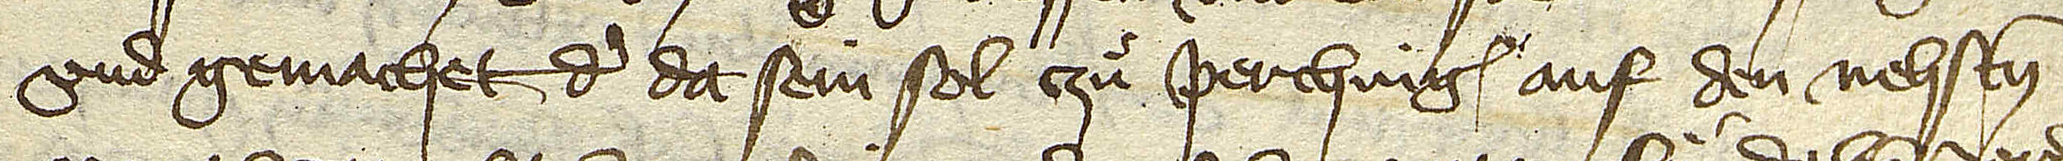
vnd gemachet d* da ſein ſol cʒü Perching* auf den nehſtn*
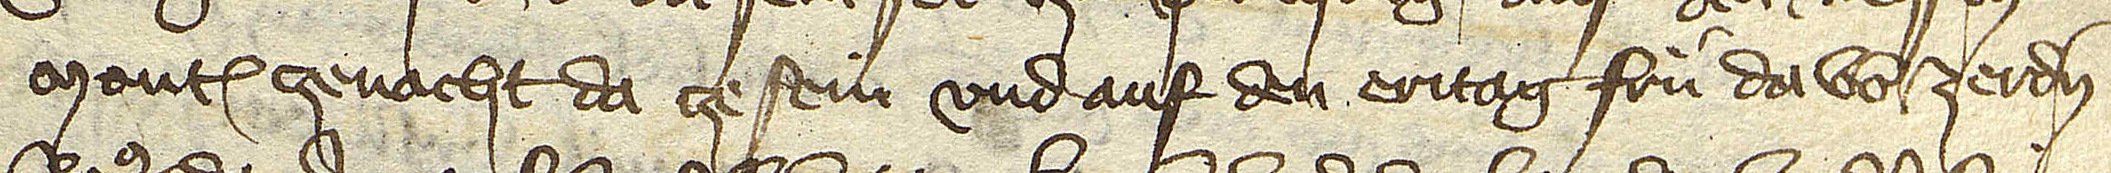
Mont* cʒenacht da cʒe ſein vnd auf den eritag frü da vo* cʒerdn*
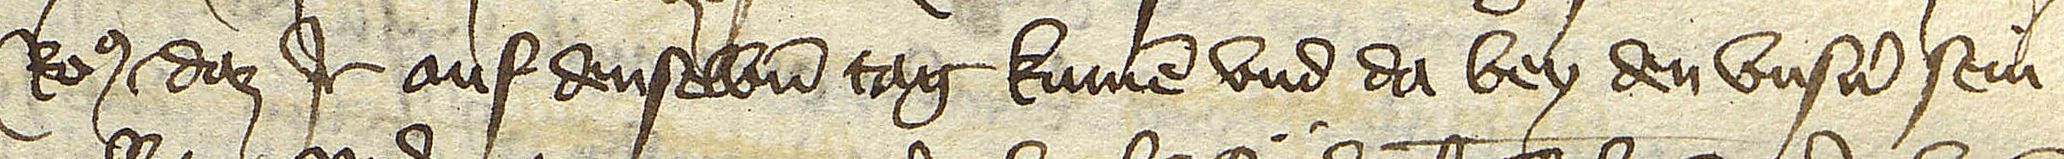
Ro* / daʒ Ir auf denſelbn* tag kume* vnd da bey den vnſn* ſein
